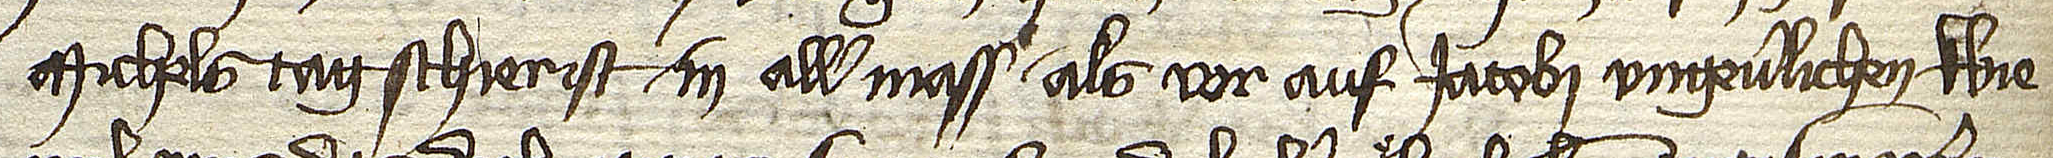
Michels tag ſchieriſt in all* maſſ / als vor auf Iacobi vngeu*lichen Wie
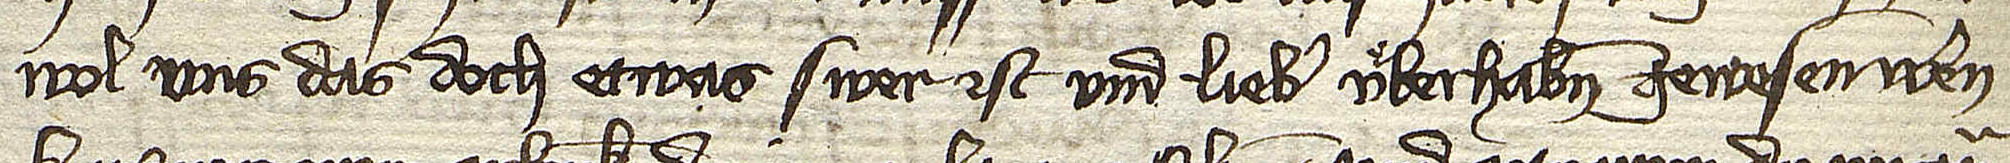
wol vns das doch etwas ſwer iſt vnd lieb* v̈berhabn* geweſen w*en
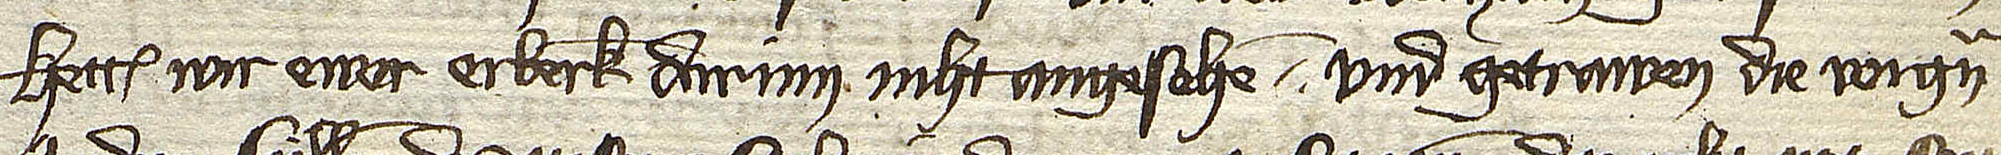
Hett* wir ewer erberk* darinn niht angeſehe* / vnd getrawen die vorgn*
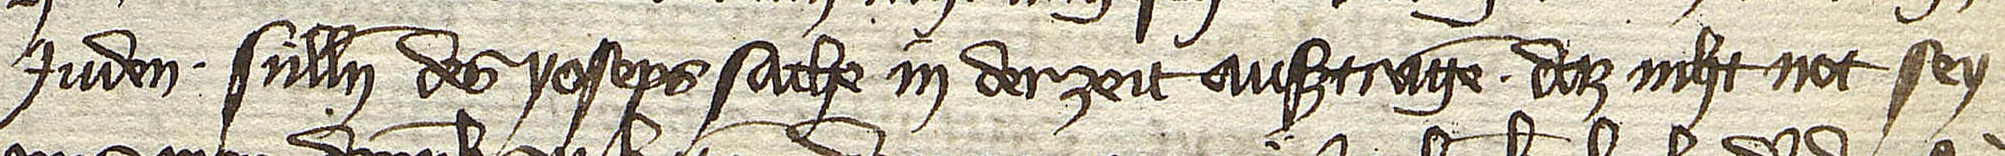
Iuden . ſülln* des yoſeps ſache in derʒeit auſʒtrage* . daʒ niht not ſey
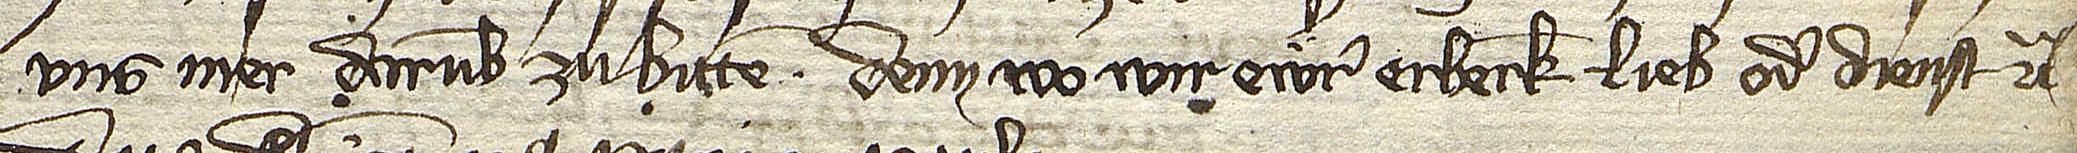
vns mer darub* ʒu bitte* . Denn wo wir eẅr* erberk* lieb od* dienſt ec*
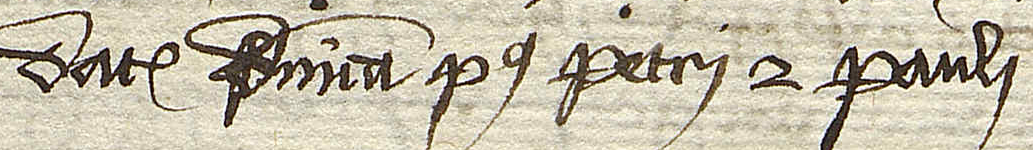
Dat* Dnica* p* Petri @ Pauli
